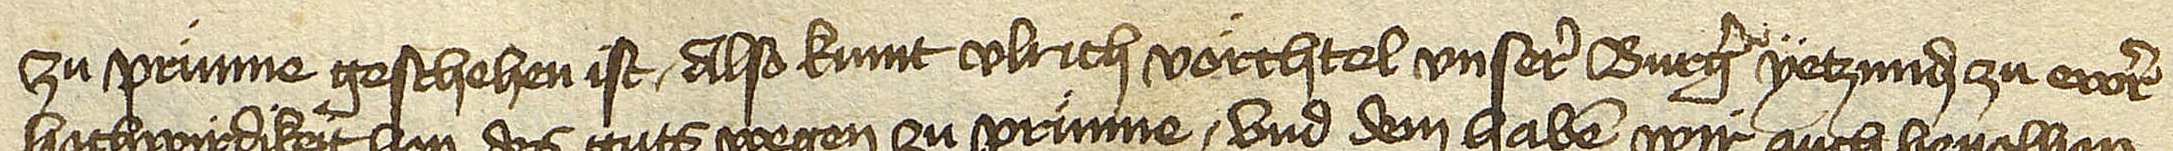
cʒu Prünne geſchehen iſt / Alſo kumt vlrich vörchtel vnſer* Burg* yetʒund* cʒu ewr*
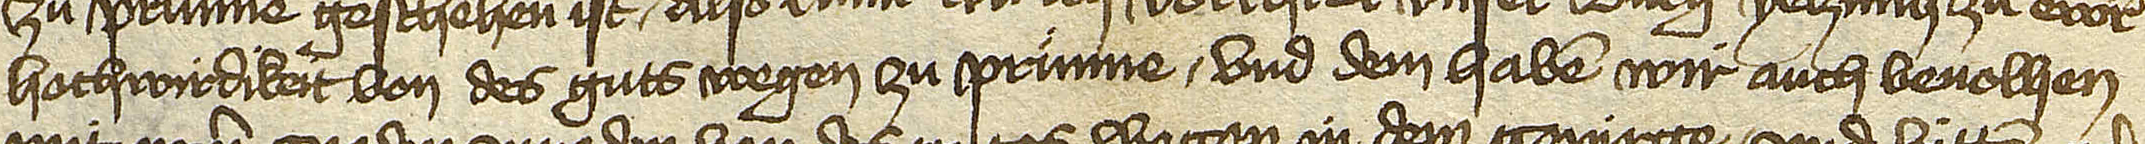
hochwirdikeit von des guts wegen cʒu Prünne / vnd dem habe* wir auch beuolhen
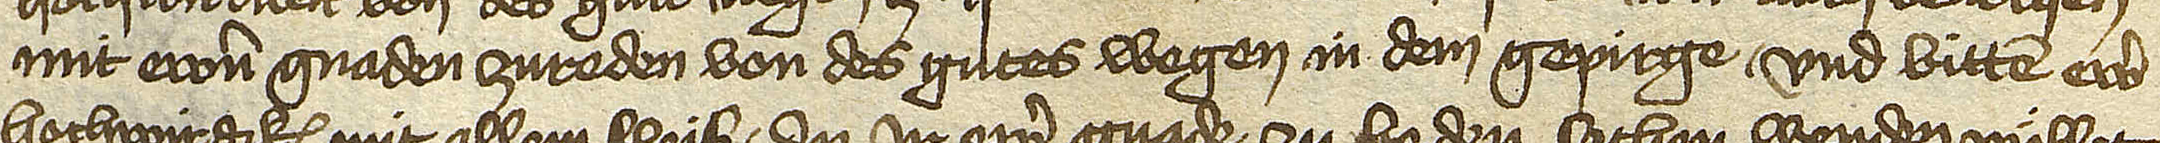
mit ew*n gnaden cʒureden von des gutes wegen in dem gepirge / vnd bitte* ew*
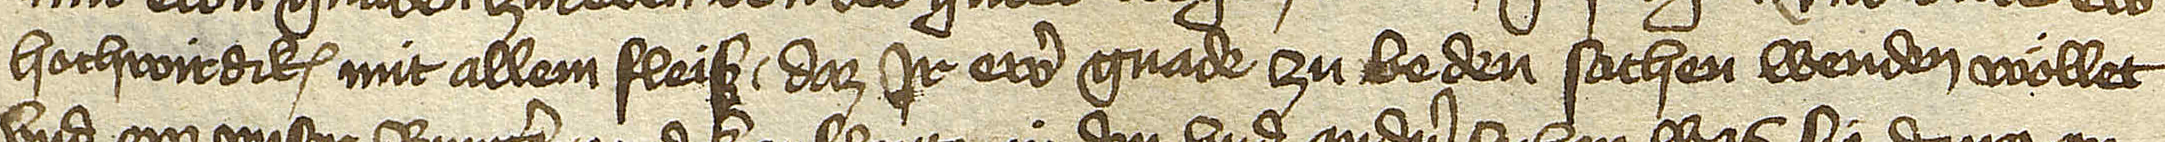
hochwirdik* mit allem fleiſʒ / daʒ Ir ew* gnade cʒu beden ſachen wenden wöllet
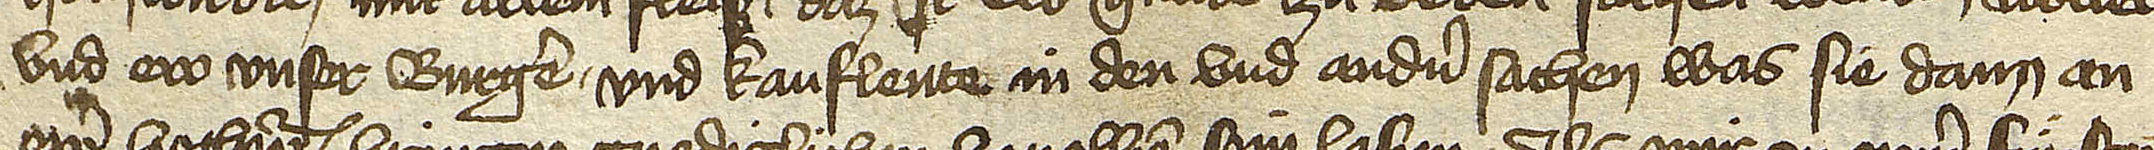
vnd ew vnſer Burge* / vnd kaufleute in den vnd andn* ſachen was ſie dann an
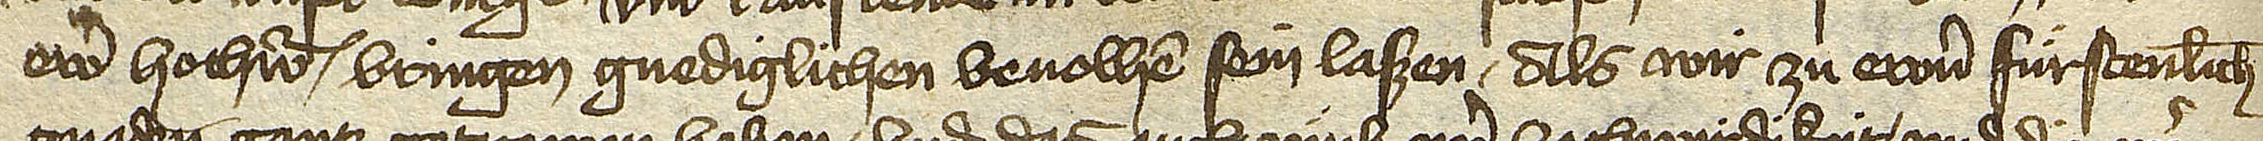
ew* hochw* / bringen gnediglichen beuolhe* ſein laſʒen / Als wir cʒu ewn* fürſtenlich*
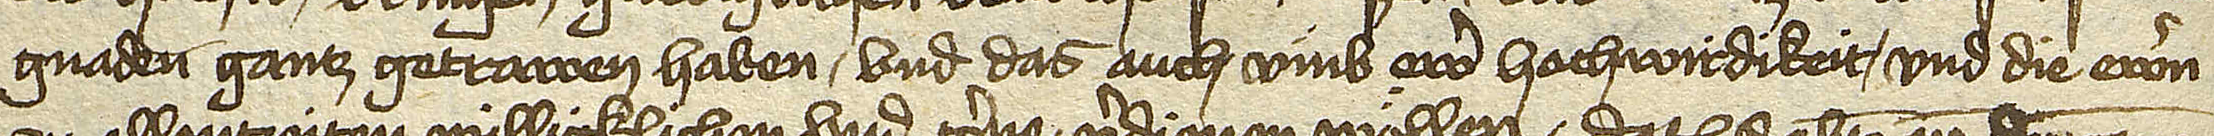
gnaden gantʒ getrawen haben / vnd das auch v̈mb ew* hochwirdikeit / vnd die ewn*
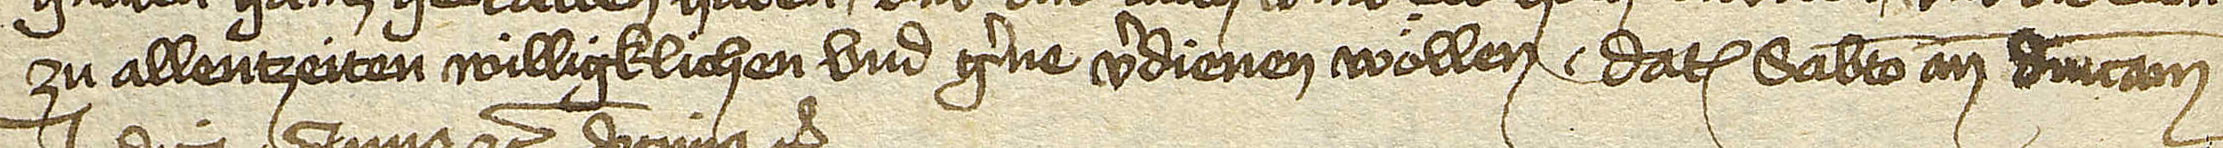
cʒu allentʒeiten williglichen vnd g*ne v*dienen wöllen / dat* Sabto* an* dmcam*
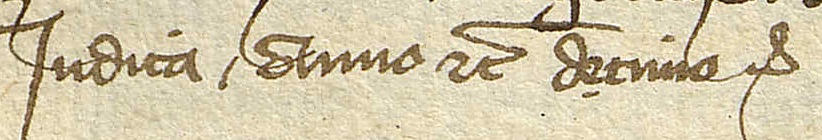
Iudica / Anno ec* decimo §
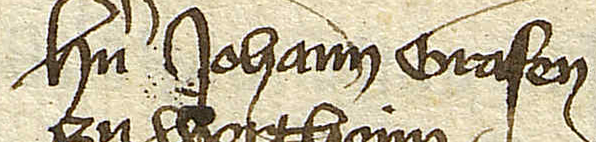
hn* Iohann Grafen
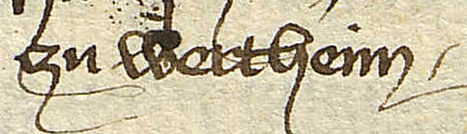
cʒu Wertheim /
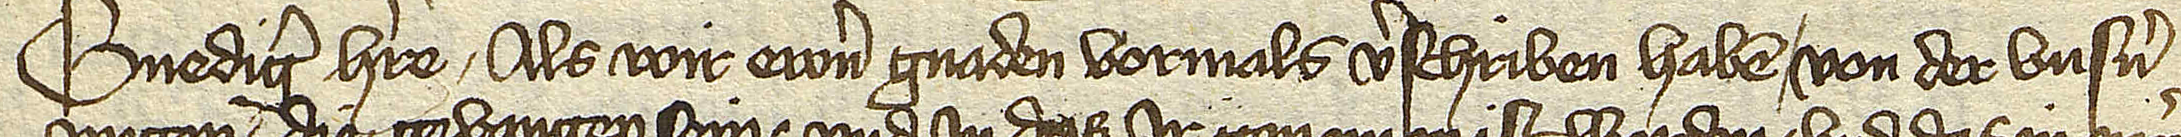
Gnedig* h*re / Als wir ewn* gnaden vormals v*ſchriben habe* / von der vnſn*
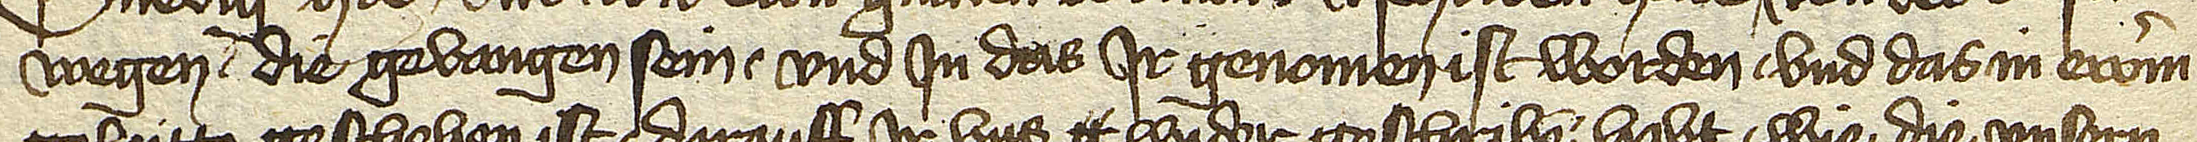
wegen / die gevangen ſein / vnd In das Ir genomen iſt worden / vnd das in ew*m
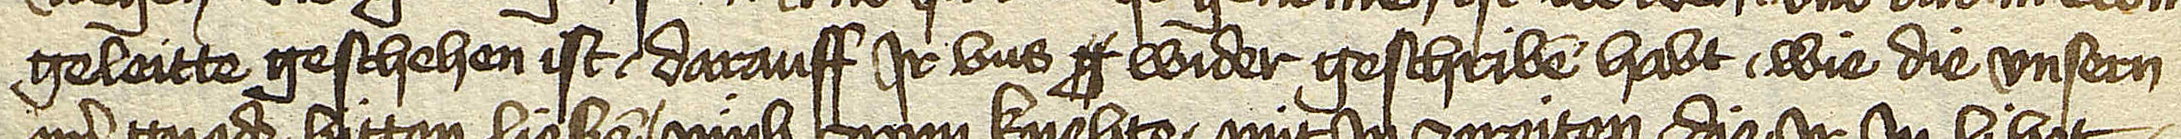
geleitte geſchehen iſt / darauff Ir vnd g wider geſchribe* habt / wie die vnſern
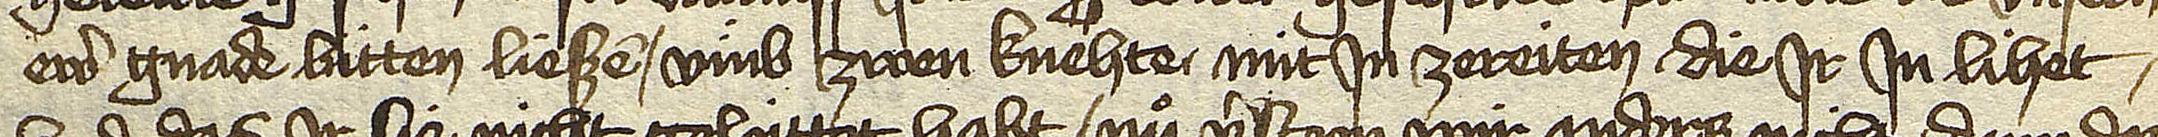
ew* gnade bitten lieſʒe* / v̈mb cʒwen knehte / mit In cʒereiten / die Ir In lihet /
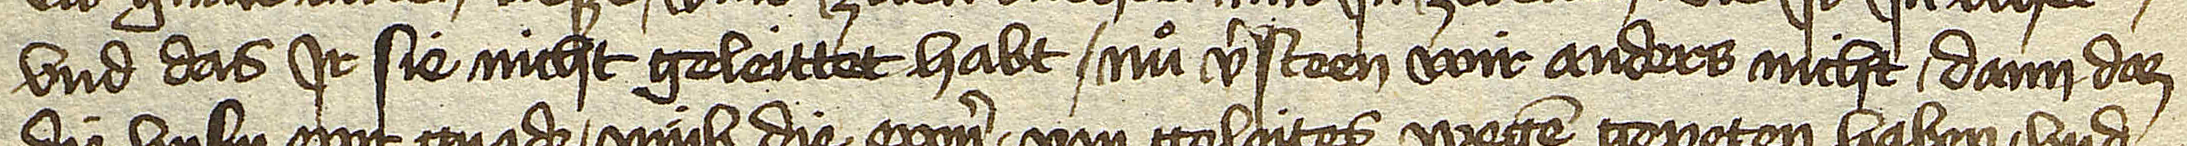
vnd das Ir ſie nicht geleittet habt / Nü v*ſteen wir anders nicht / dann daʒ
